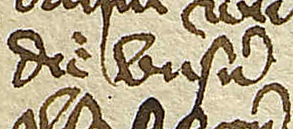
die vnſn*
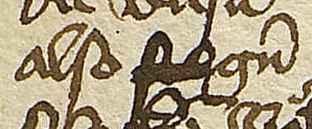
alſo ſel gn*
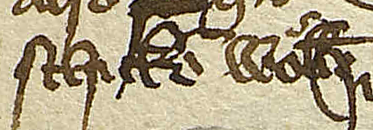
ſchicke* wölle*
